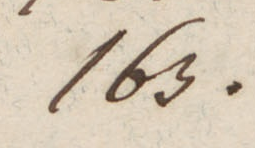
163.
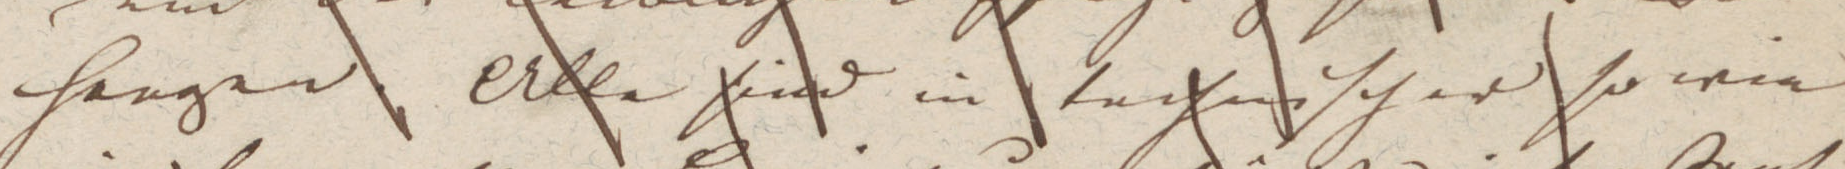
hangen. Alle sind in technischer so wie
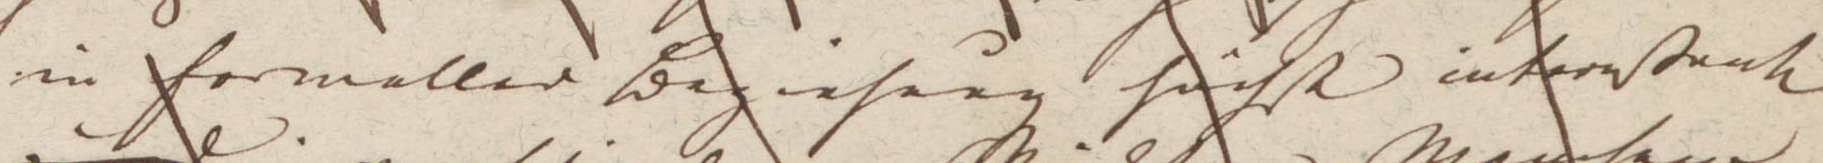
in formeller Beziehung höchst interessant
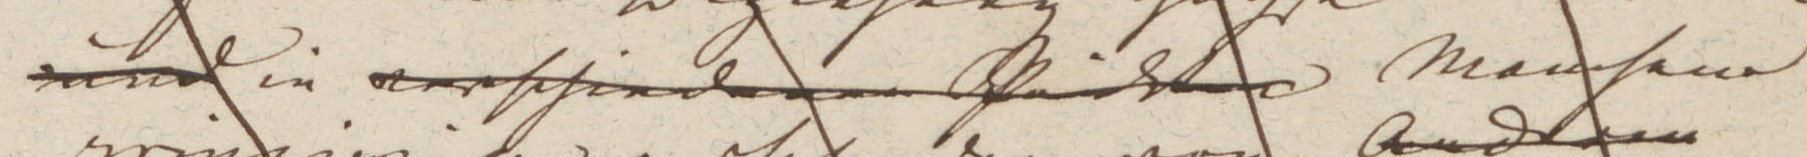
und in verschiedenen Punkten Manchem
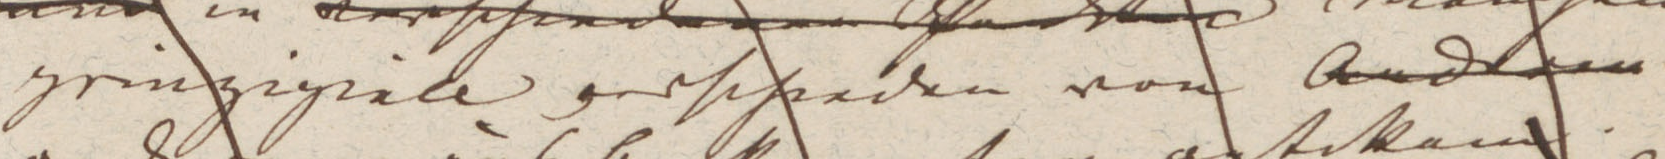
prinzipiell verschieden von Anderen
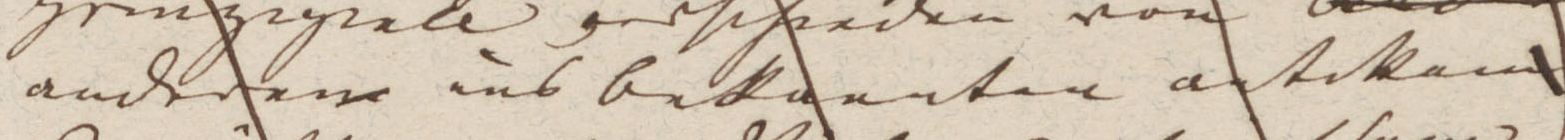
anderemn uns bekannten antikemn
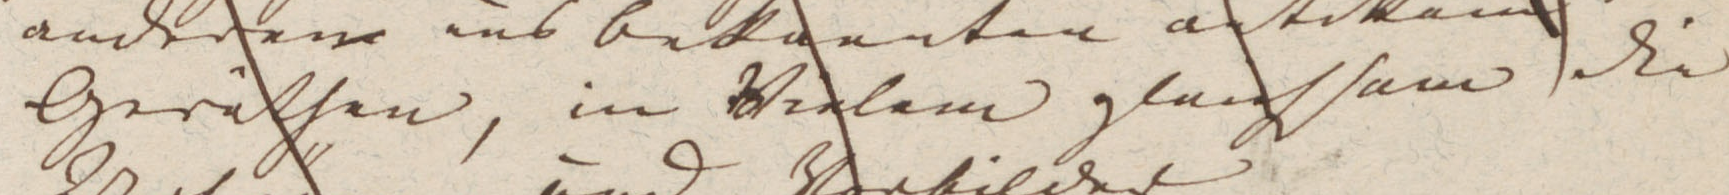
Geräthen, in Vielem gleichsam die
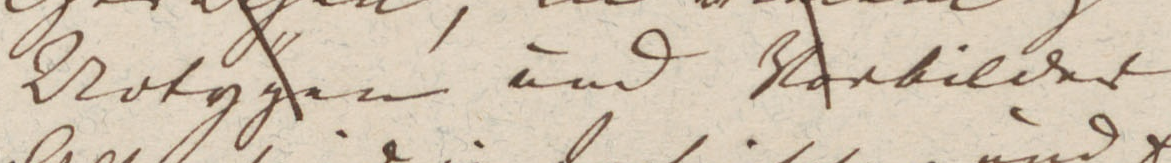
Urtypen und Vorbilder
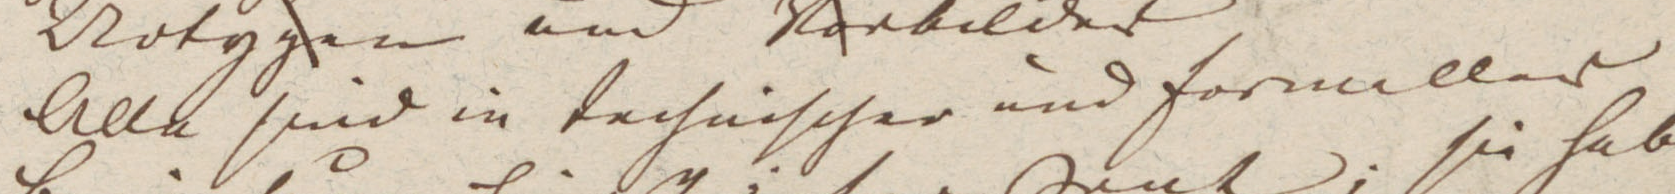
Alle sind in technischer und formeller
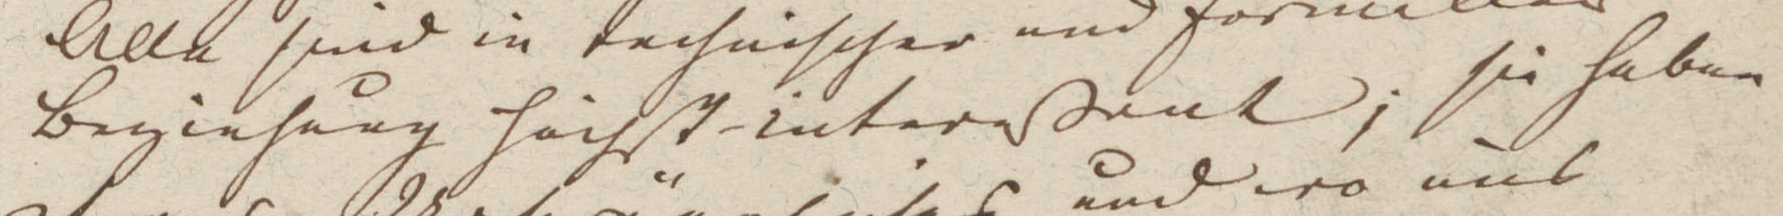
Beziehung höchst-interessant; sie haben
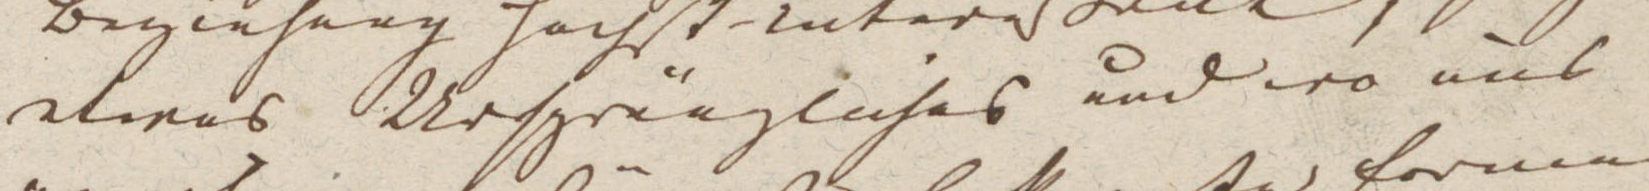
etwas Ursprüngliches und wo uns
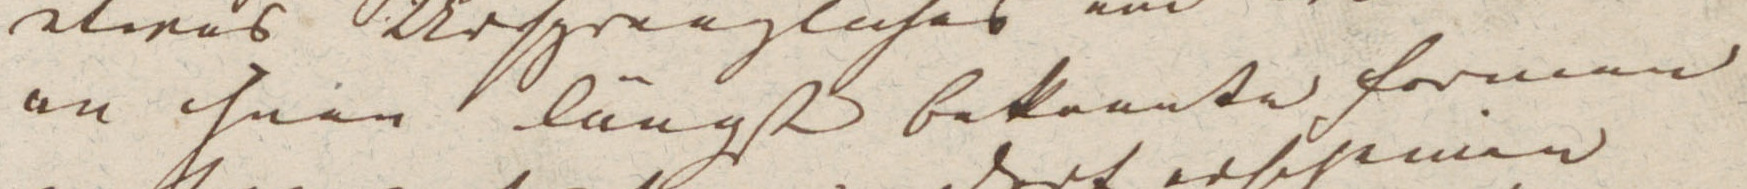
an ihnen längst bekannte Formen
